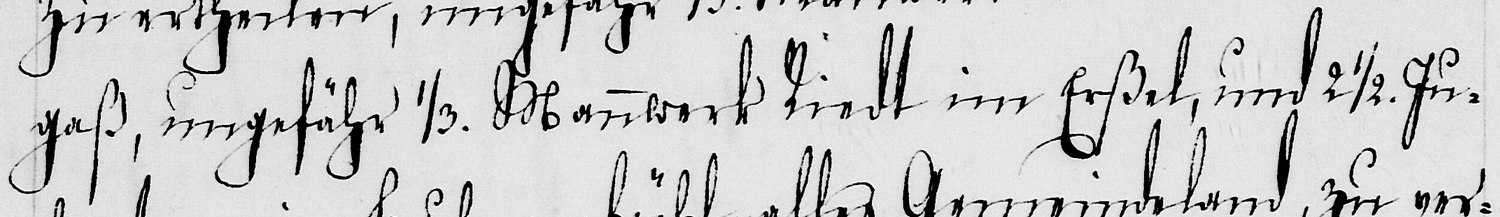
gaß, ungefähr 1/3 Mannwerk Riedt im Erßel, und 2 1/2. Ju¬
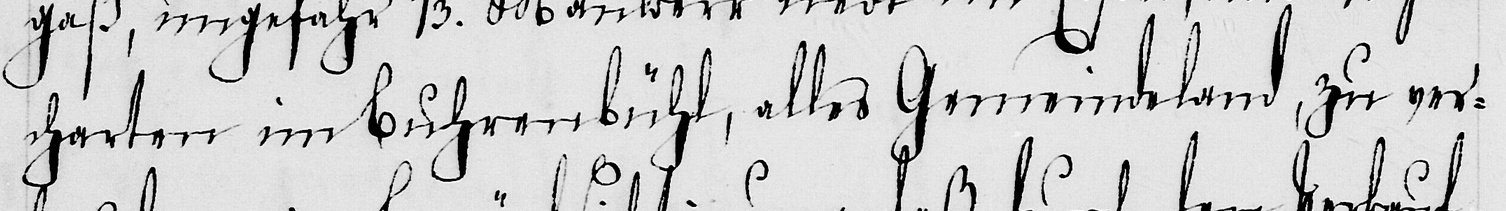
charten im Buhrenbühl, alles Gemeindeland, zu ver¬
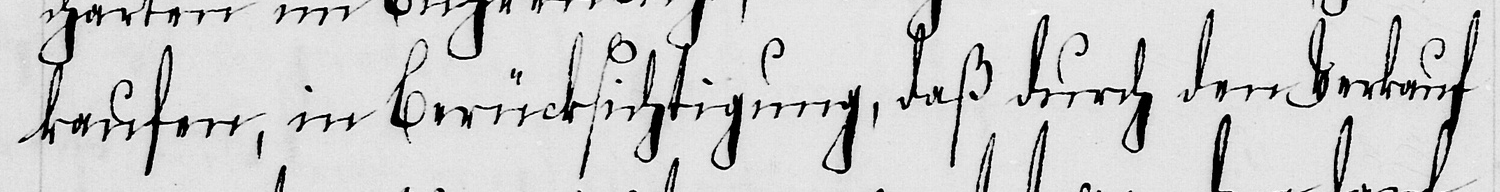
kaufen, in Berücksichtigung, daß durch den Verkauf
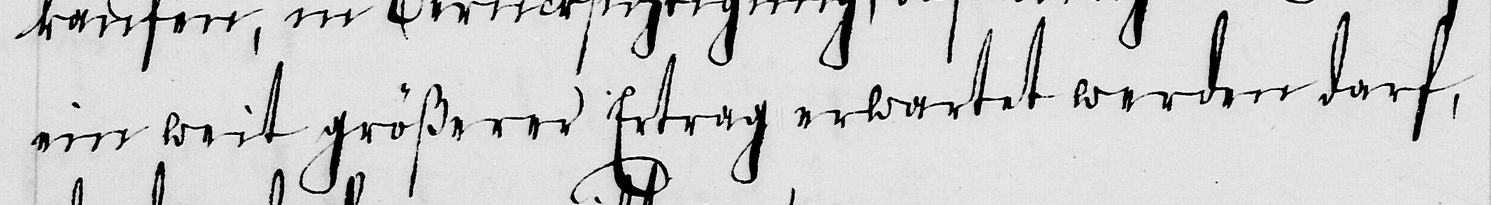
ein weit größerer Ertrag erwartet werden darf,
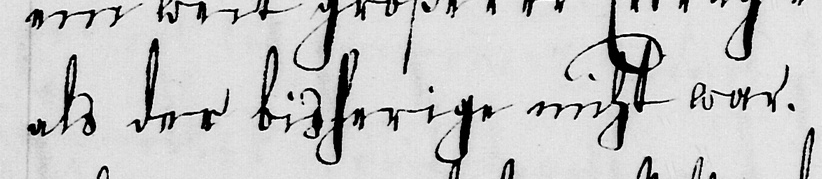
als der bisherige nicht war.
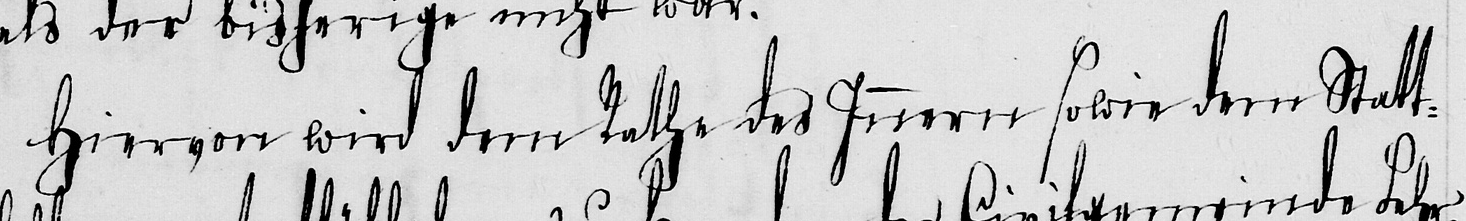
Hiervon wird dem Rathe des Innern sowie dem Statt¬
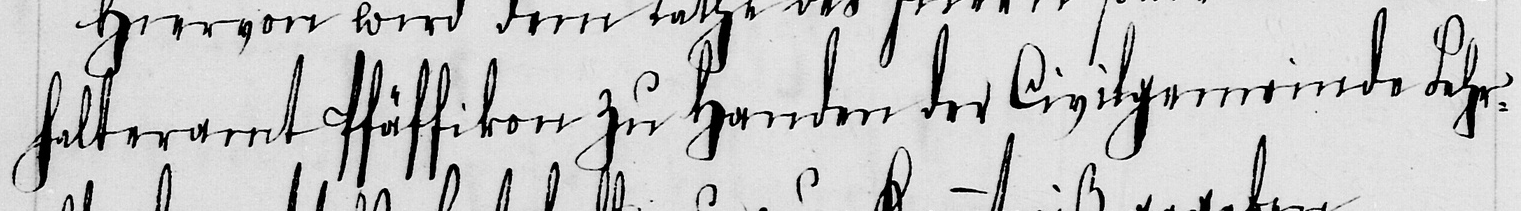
halteramt Pfäffikon zu Handen der Civilgemeinde Feh¬
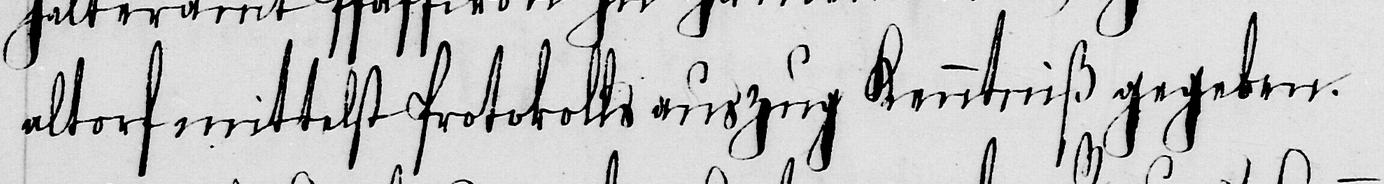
altorf mittelst Protokollsauszug Kenntniß gegeben.
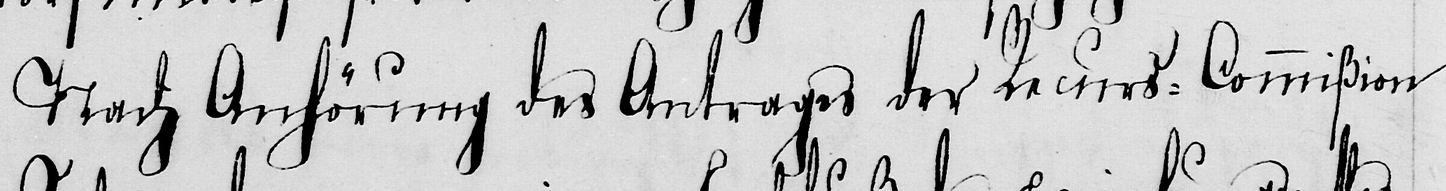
Nach Anhörung des Antrages der Recurs-Commißion
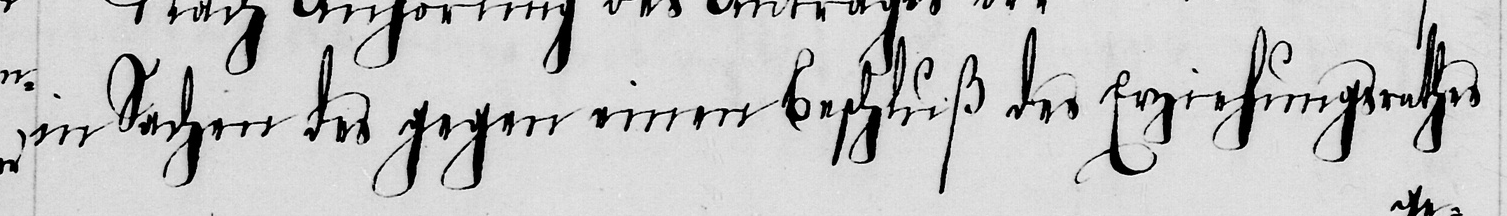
in Sachen des gegen einen Beschluß des Erziehungsrathes
